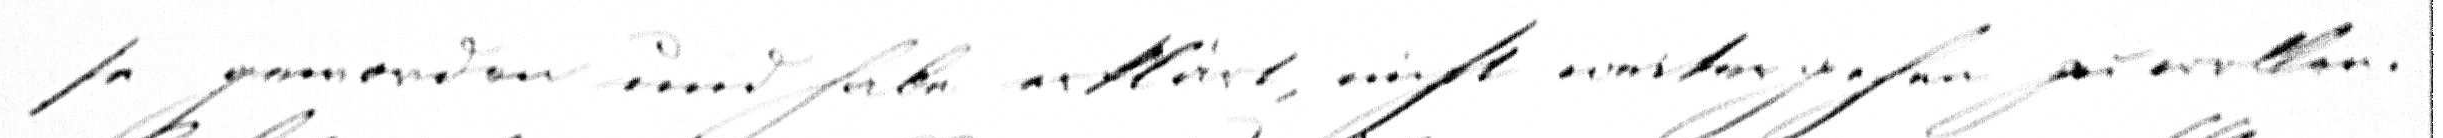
se geworden und habe erklärt, nicht weiter gehen zu wollen.
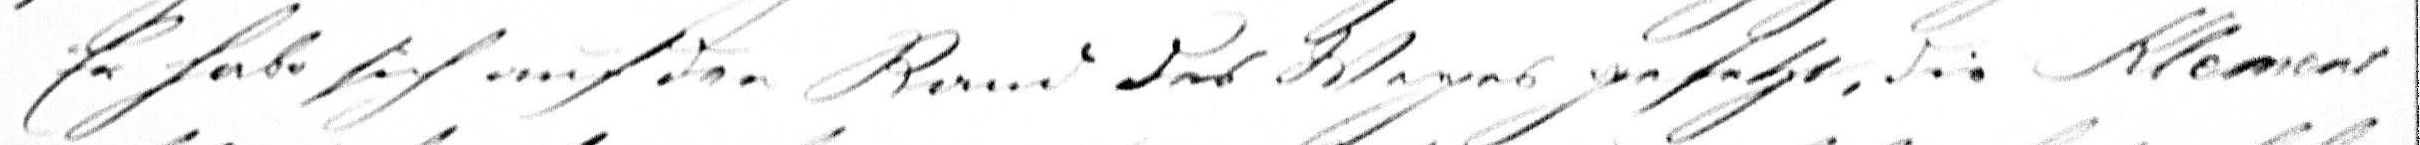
Er habe sich auf den Rand des Weges gesetzt, die Klement
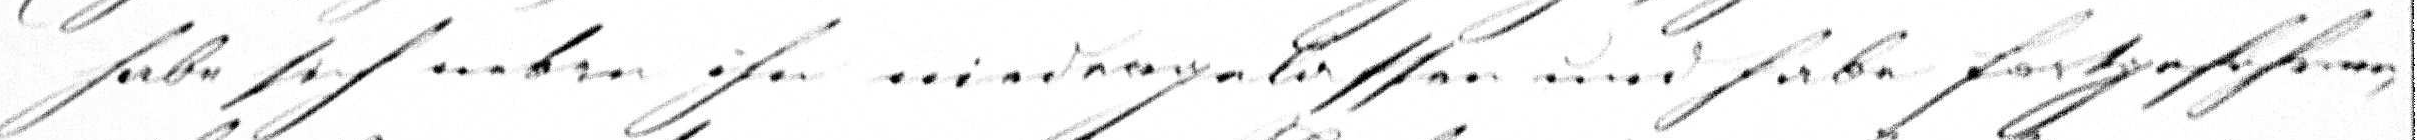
habe sich neben ihn niedergelassen und habe fortgefahren,
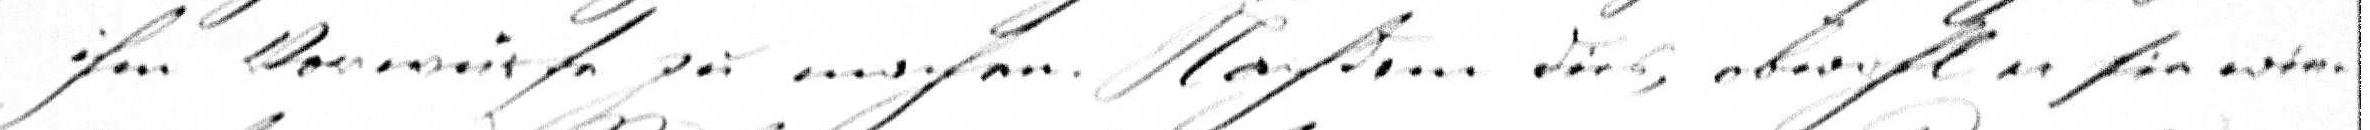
ihm Vorwürfe zu machen. Nachdem dies, obwohl er sie wie¬
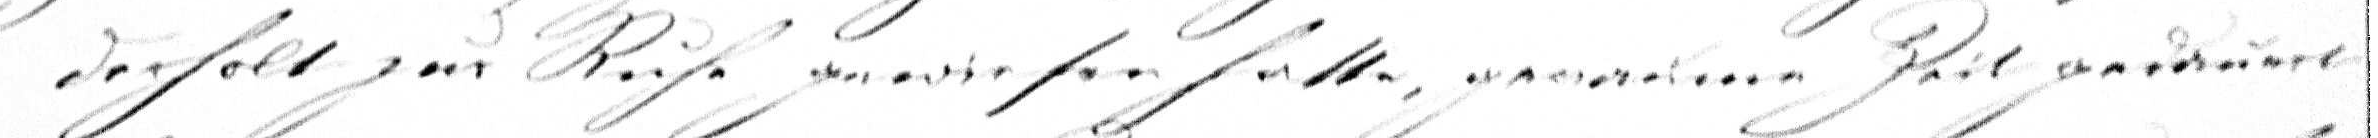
derholt zur Ruhe zuwiesen hatte, geraume Zeit gedauert
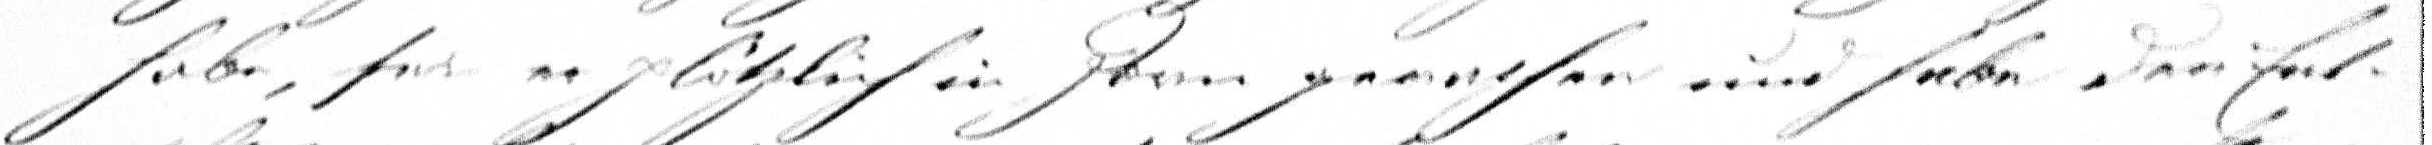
habe, sei er plötzlich in Zorn gerathen und habe den Ent¬
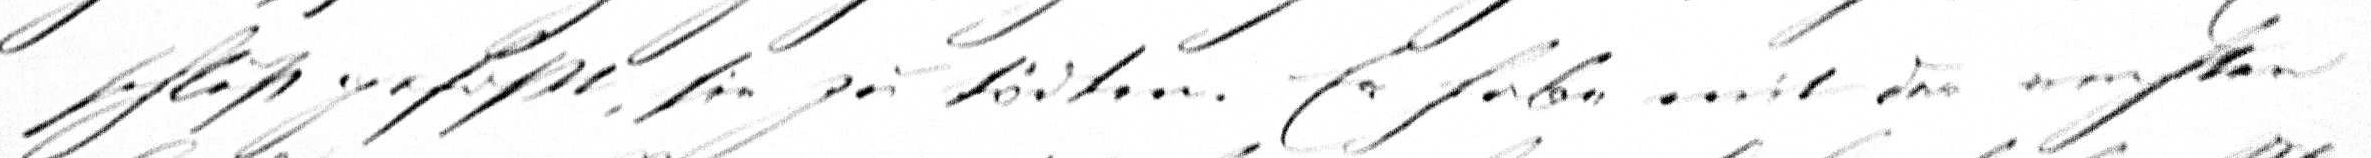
schluß gefaßt, sie zu tödten. Er habe mit der rechten
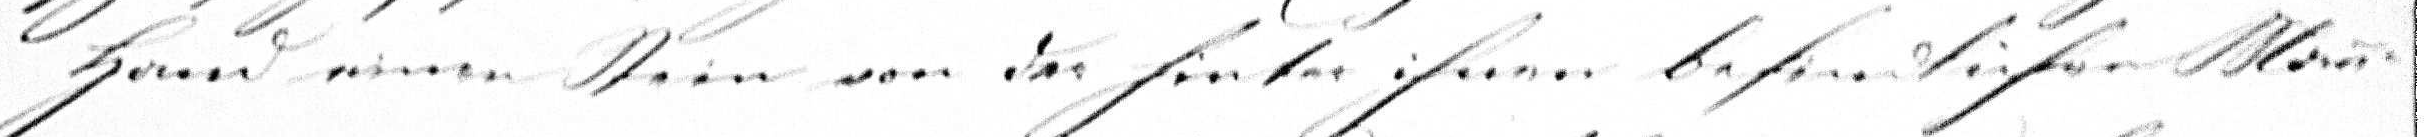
einen Stein von der hinter ihnen befindlichen Mau¬
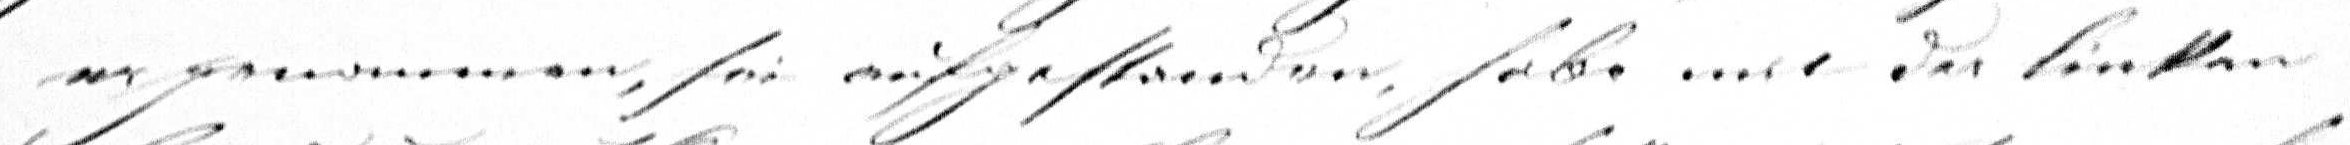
er genommen, sei aufgestanden, habe mit der linken
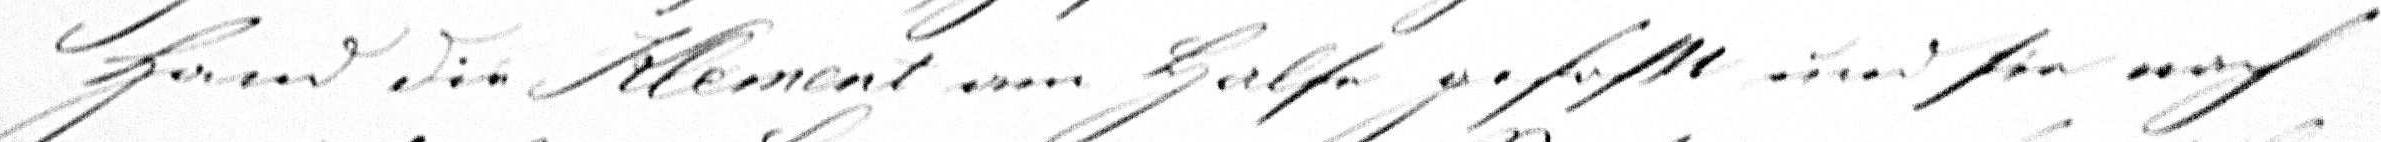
Hand die Klement am Halse gefaßt und sie nach
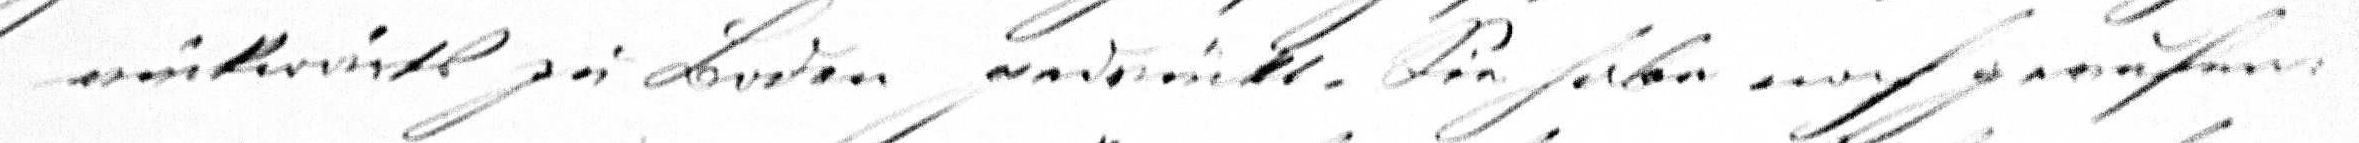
rückwärts zu Boden gedrückt. Sie habe noch gerufen:
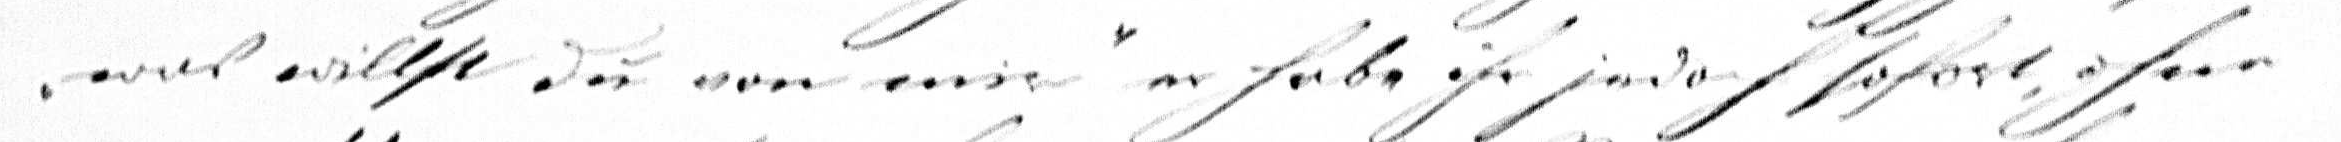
„was willst du von mir“ er habe ihr jedoch sofort, ohne
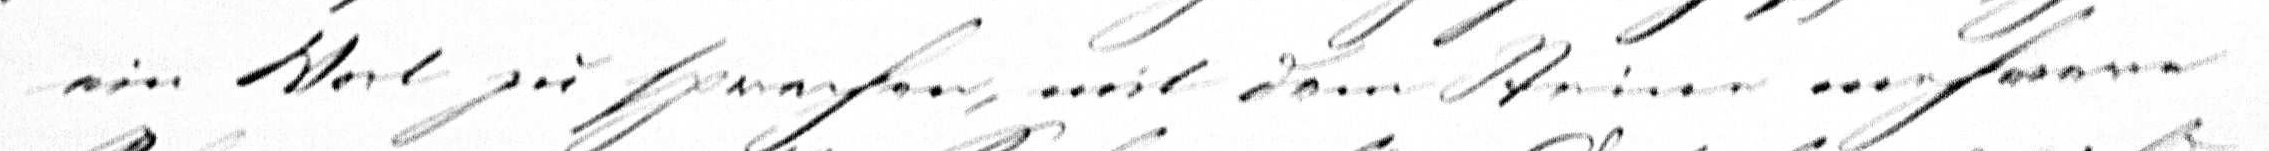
ein Wort zu sprechen, mit dem Steine mehrere
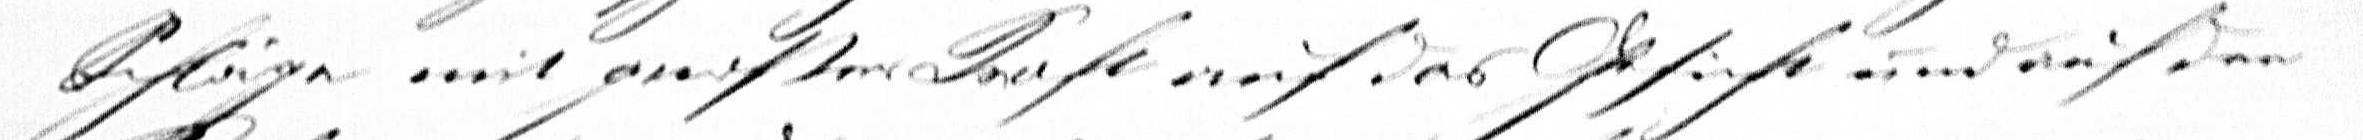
Schläge mit großer Kraft auf das Gesicht und auf den
